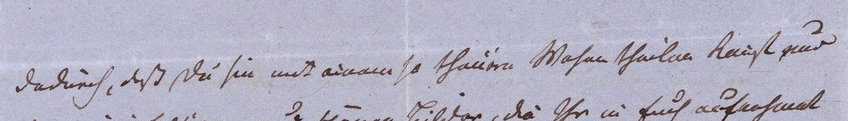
dadurch, daß Du sie mit einem so theu'ren Wesen theilen kannst und
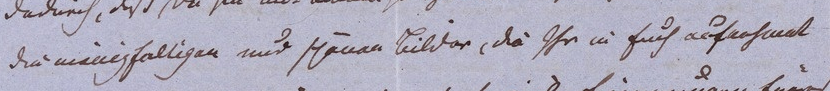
die mannigfaltigen und schönen Bilder, die Ihr in Euch aufnehmet
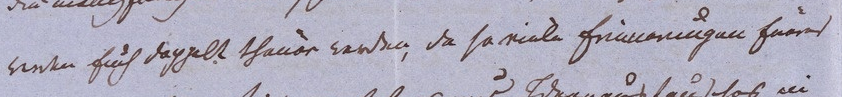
werden Euch doppelt theuer werden, da so viele Erinnerungen Eueres
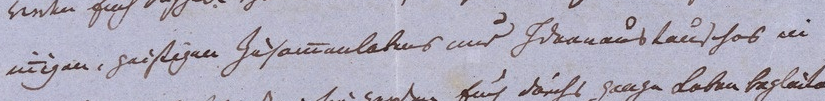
innigen, geistigen Zusammenlebens und Ideenaustausches in
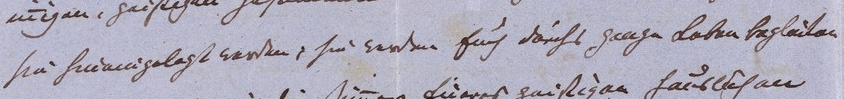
sie hineingelegt werden; sie werden Euch durchs ganze Leben begleiten
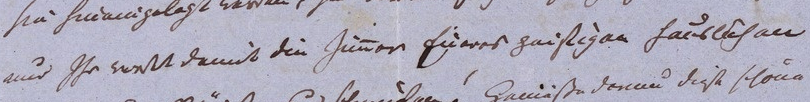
und Ihr werdet damit die Zimmer Eueres geistigen hauslichen
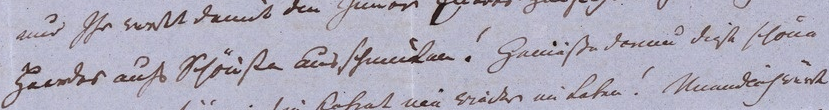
Heerdes aufs Schönste ausschmücken! Genieße darum diese schöne
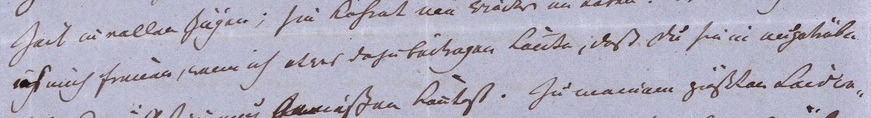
ich mich freuen, wenn ich etwas dazu beitragen könnte, daß Du sie in ungetrüb-
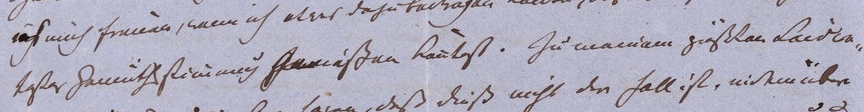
tester Gemüthsstimmung genießen könntest. Zu meinem größten Leidwe-
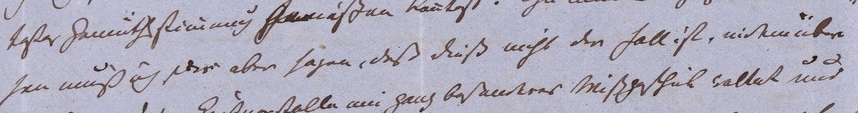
sen muß ich Dir aber sagen, daß dieß nicht der Fall ist, indem über
